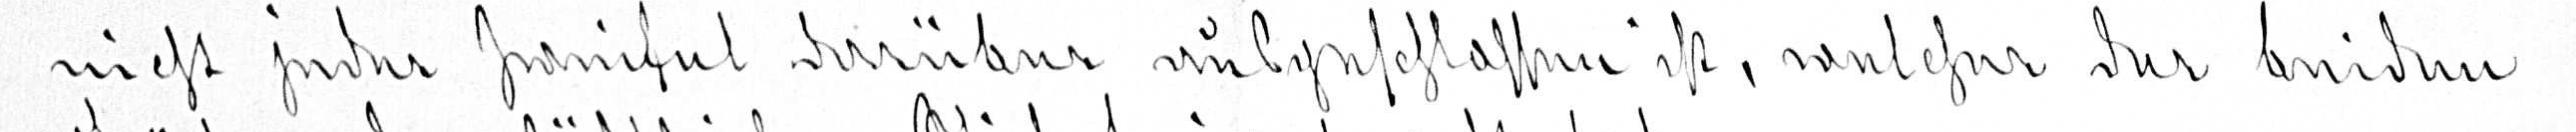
nicht jeder Zweifel darüber ausgeschlossen ist, welcher der beiden
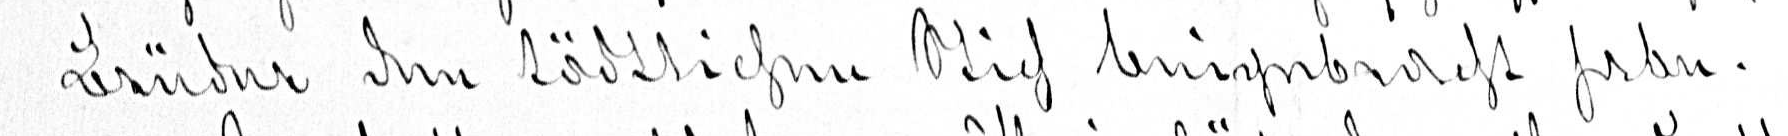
Brüder den tödtlichen Stich beigebracht habe.
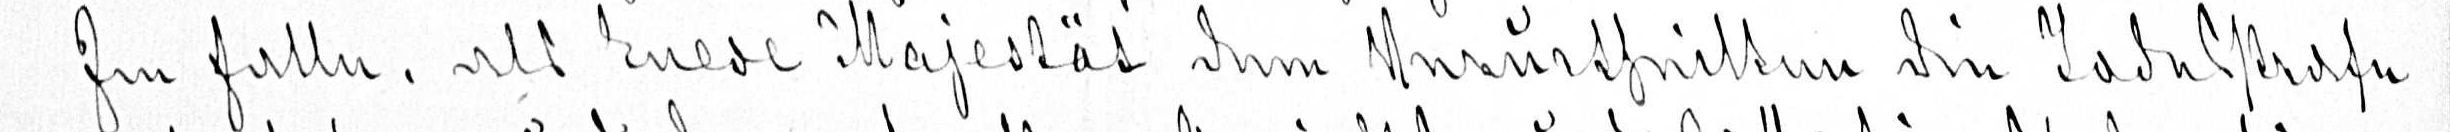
Im Falle, als Euere Majestät dem Verurtheilten die Todesstrafe
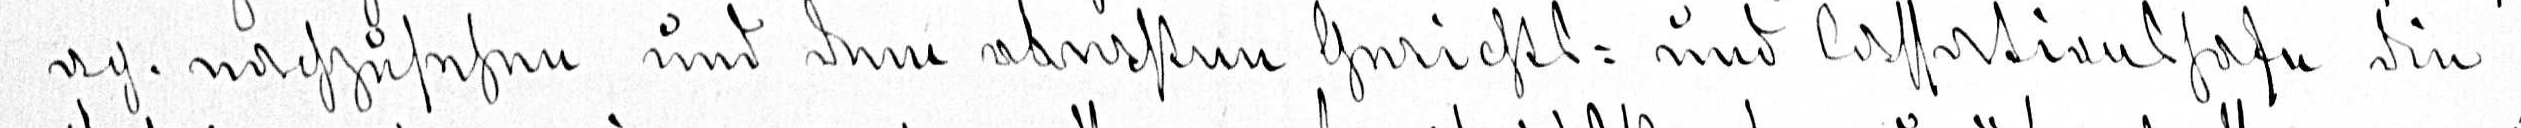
ag. nachzusehen und dem obersten Gerichts- und Cassationshofe die
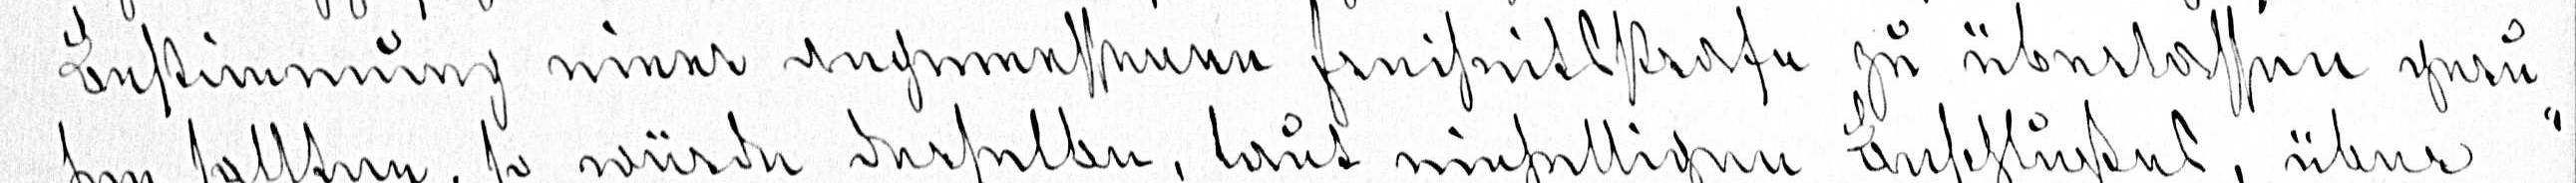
Bestimmung einer angemessenen Freiheitsstrafe zu überlassen geru¬
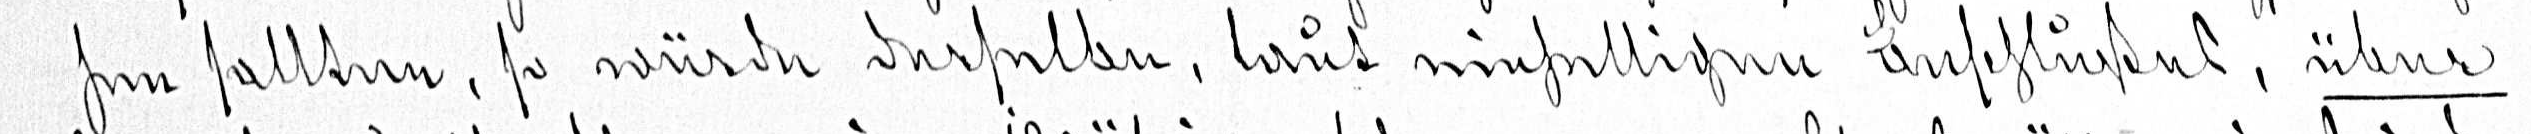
hen sollten, so würde derselbe, laut einhelligen Beschlußes, über
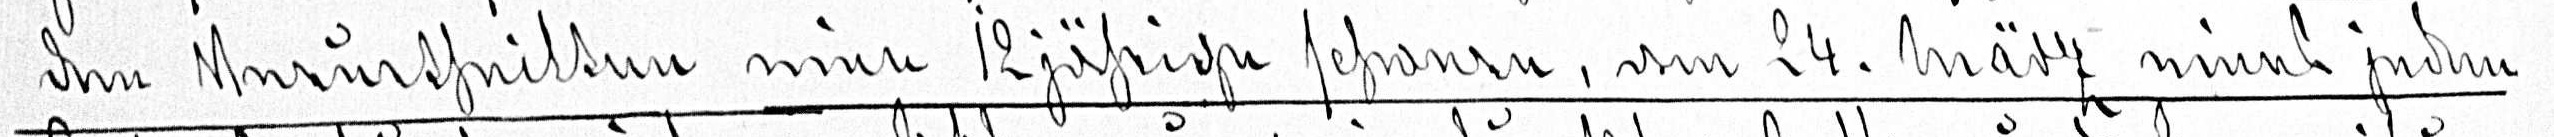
den Verurtheilten eine 12jährige schwere, am 24. März eines jeden
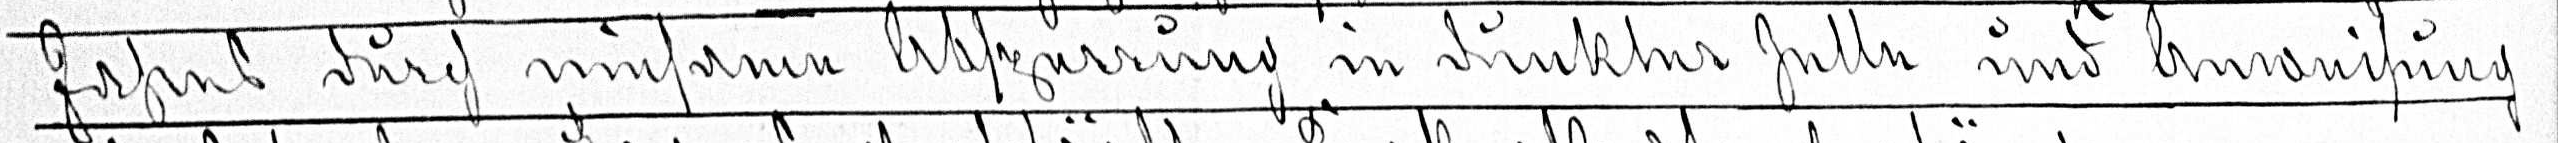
Jahres durch einsame Absperrung in dunkler Zelle und Anweisung
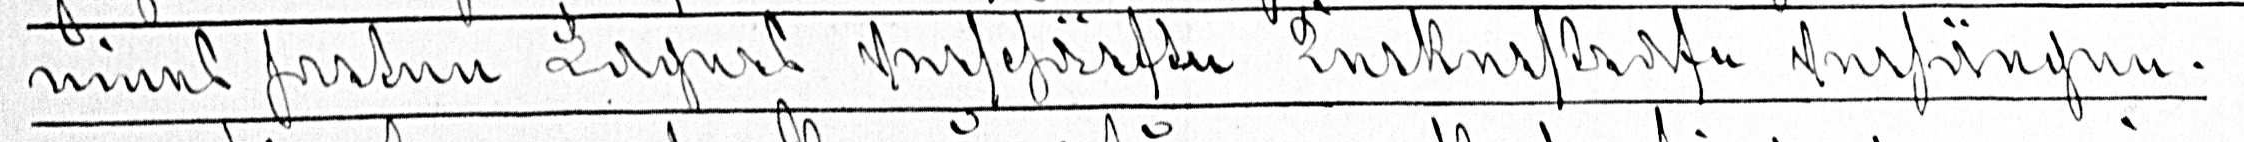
eines harten Lagers verschärfte Kerkerstrafe verhängen.
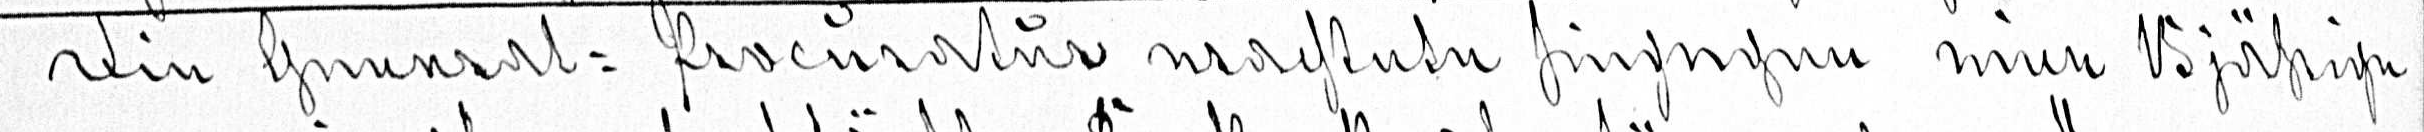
Die General-Procuratur erachtete hingegen eine 15jährige
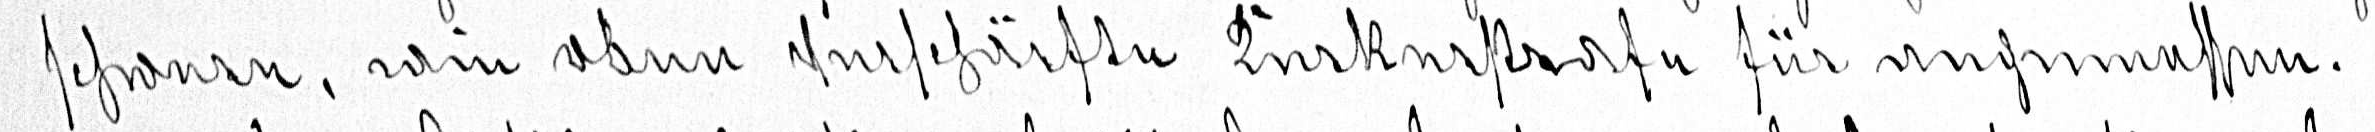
schwere, wie oben verschärfte Kerkerstrafe für angemessen.
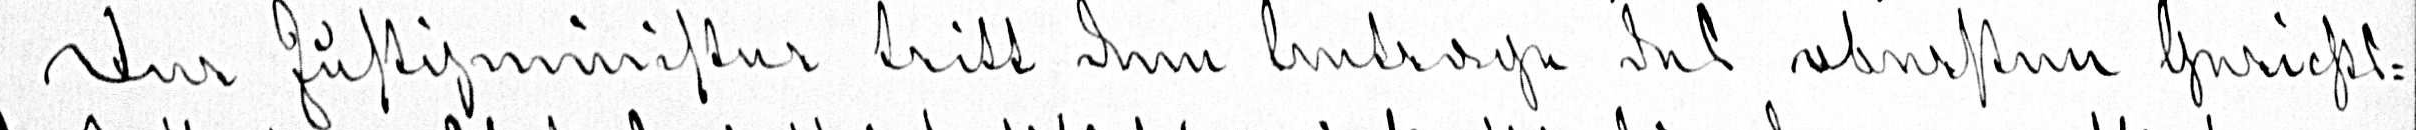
Der Justizminister tritt dem Antrage des obersten Gerichts-
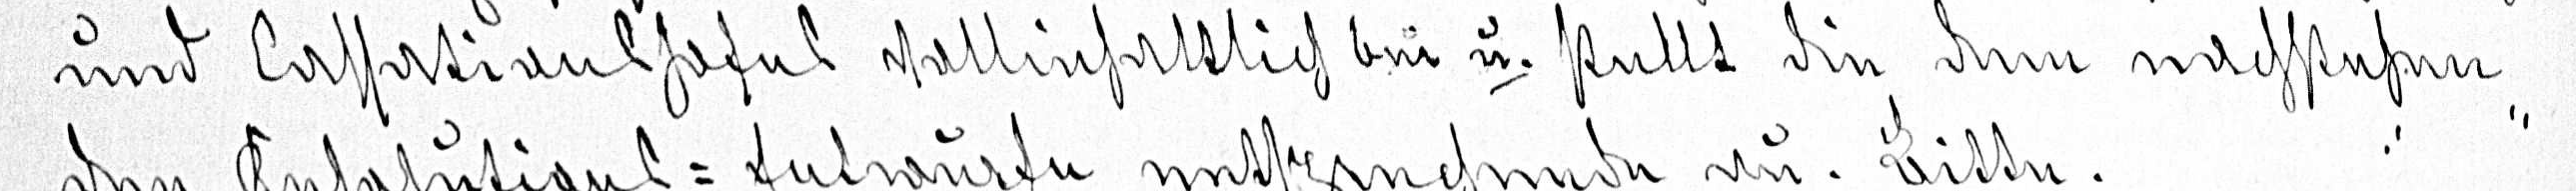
und Cassationshofes vollinhaltlich bei u. stellt die dem nachstehen¬
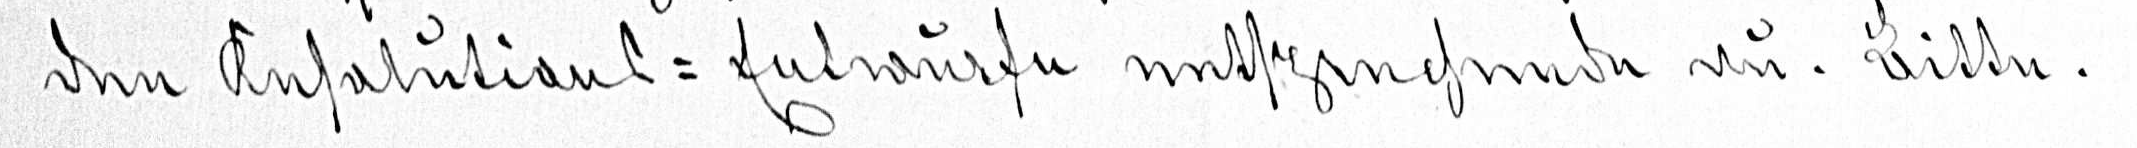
den Resolutions-Entwurfe entsprechende au. Bitte.
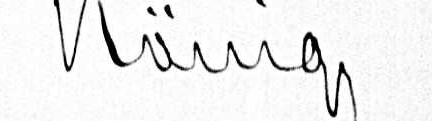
König
